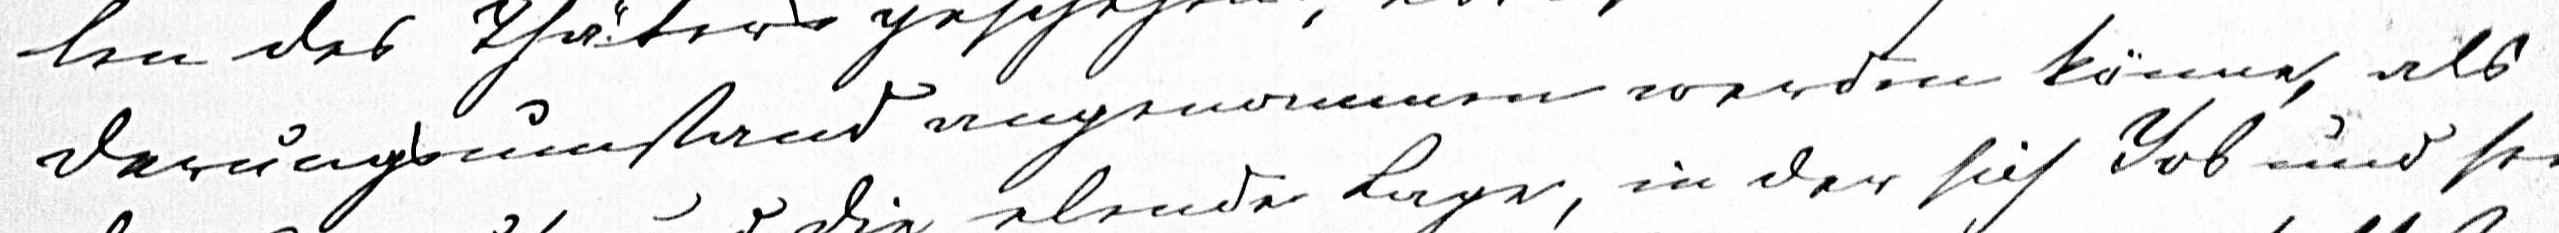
derungsumstand angenommen werden könne, als
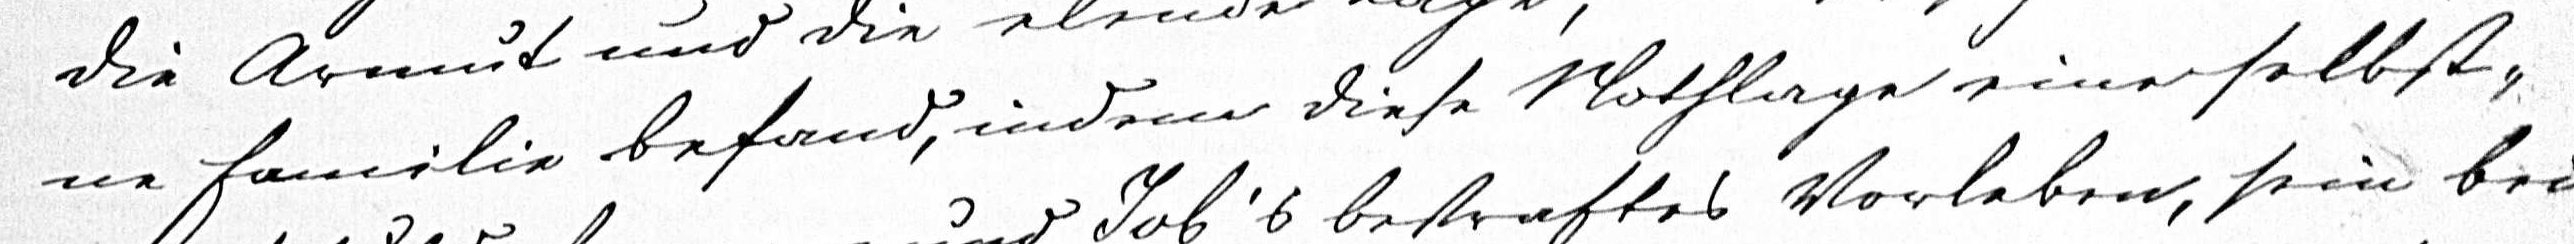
die Armut und die elende Lage, in der sich Job und sei¬
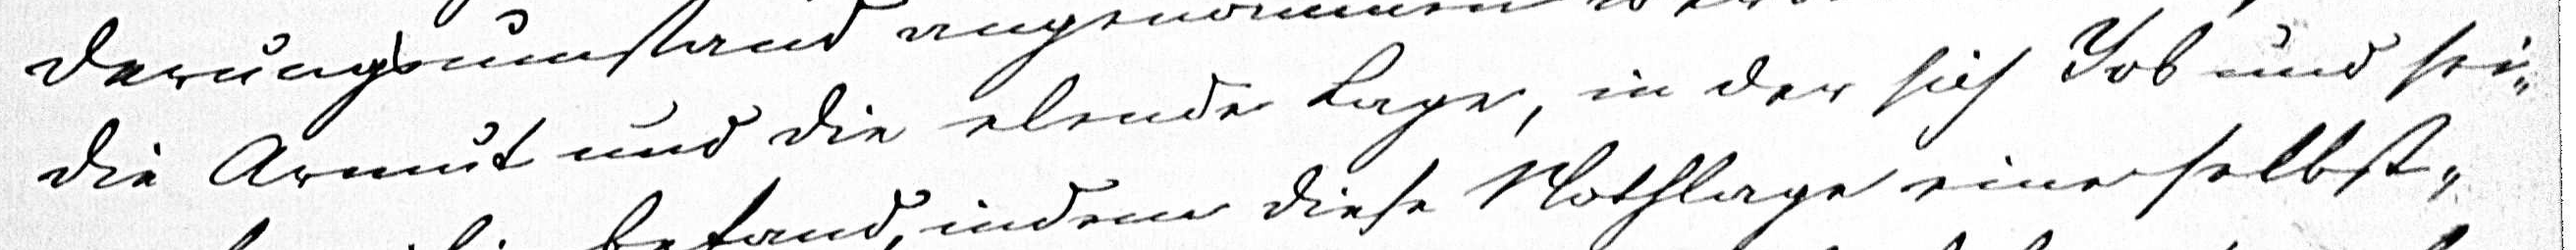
ne Familie befand, indem diese Nothlage eine selbst¬
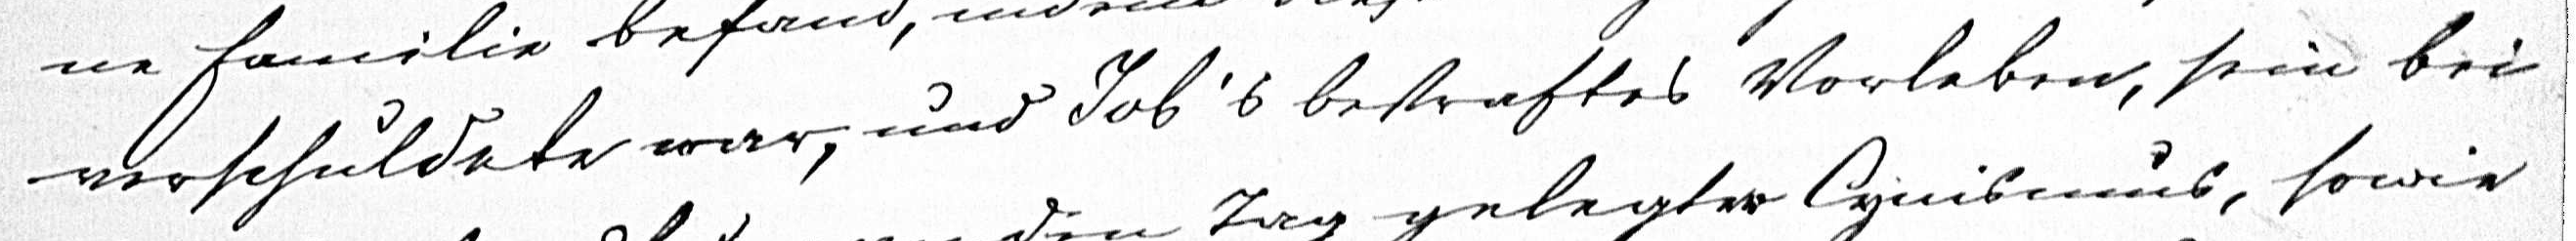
verschuldete war, und Job’s bestraftes Vorleben, sein bei
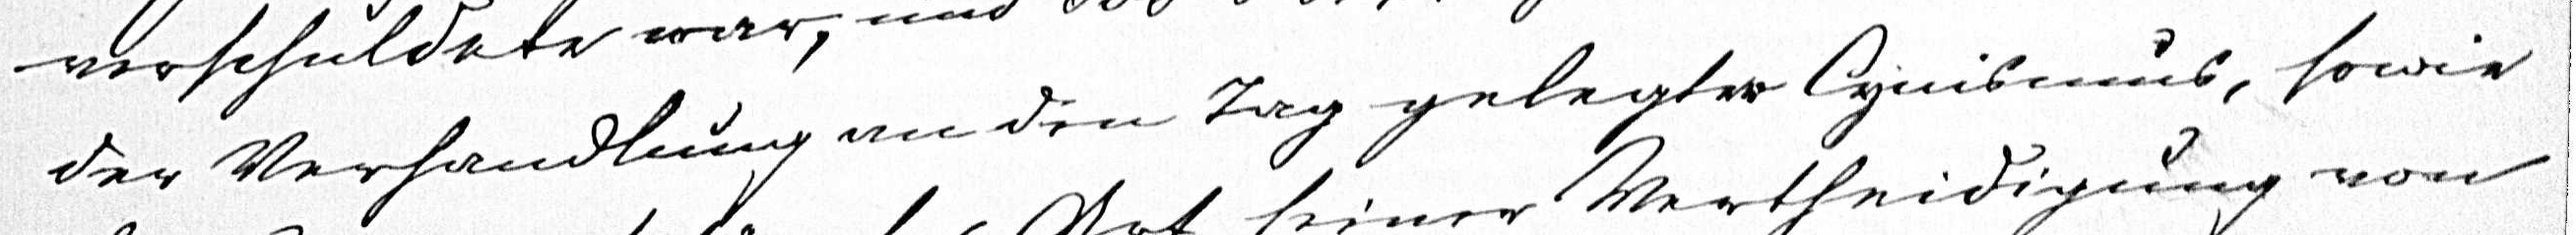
der Verhandlung an den Tag gelegter Cynismus, sowie
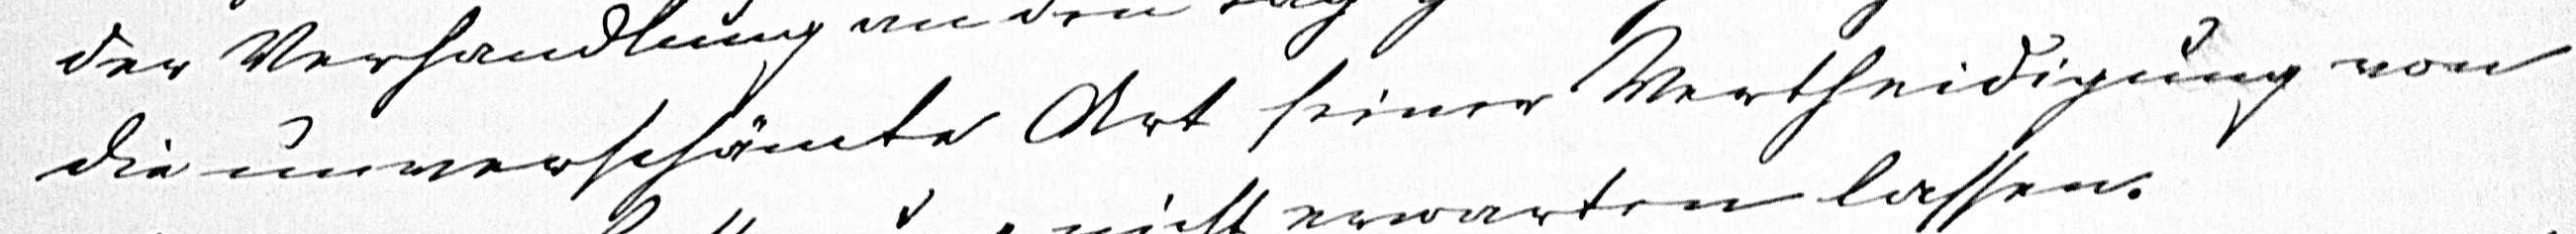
die unverschämter Art seiner Vertheidigung von
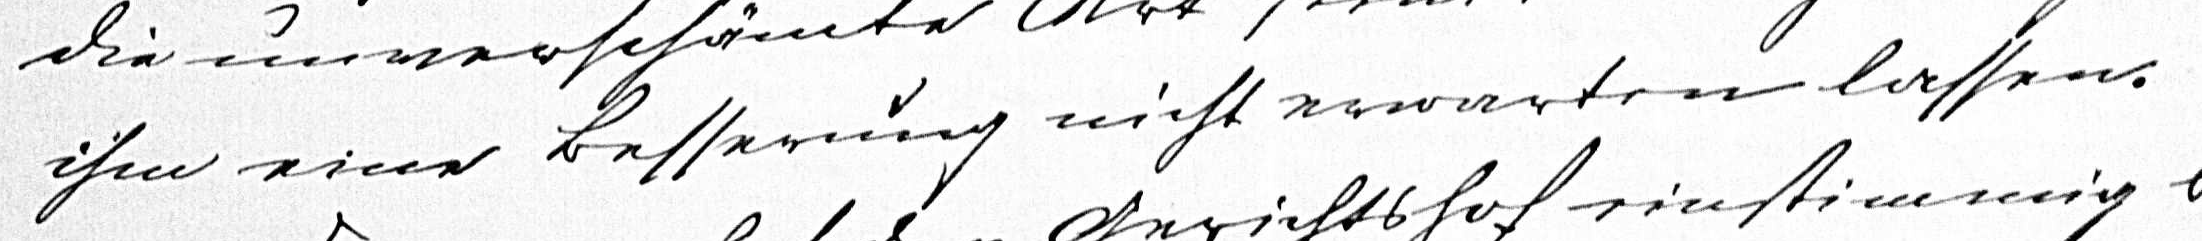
ihm einer Besserung nicht erwarten lassen.
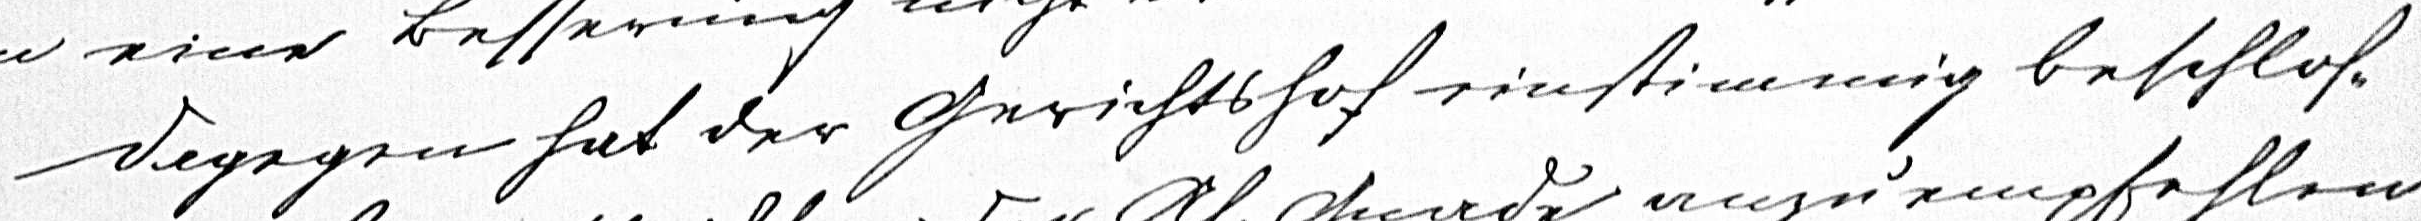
Dagegen hat der Gerichtshof einstimmig beschlos¬
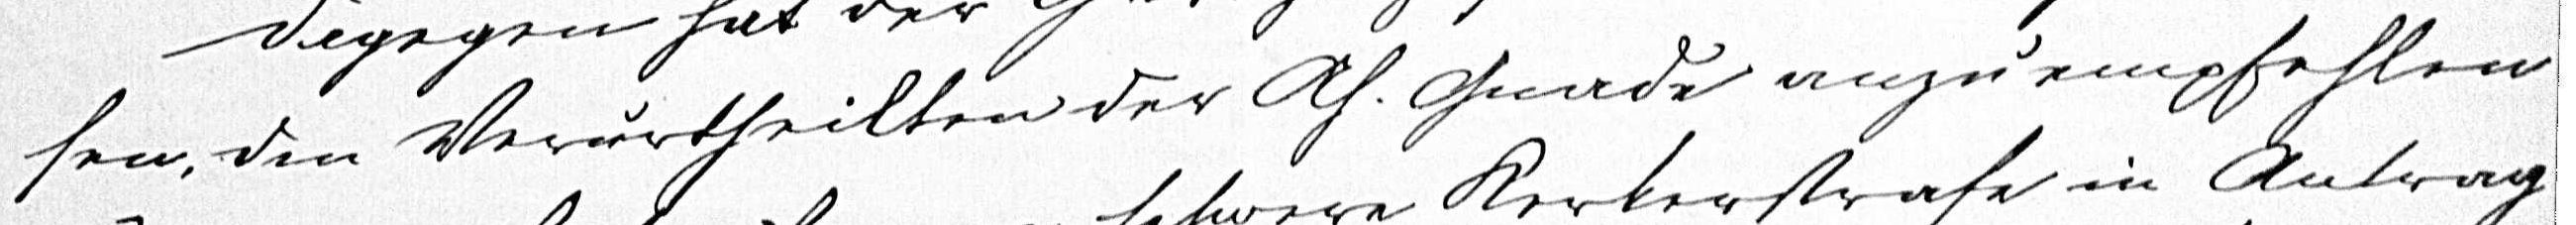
sen, den Verurtheilten der Ah. Gnade anzuempfehlen
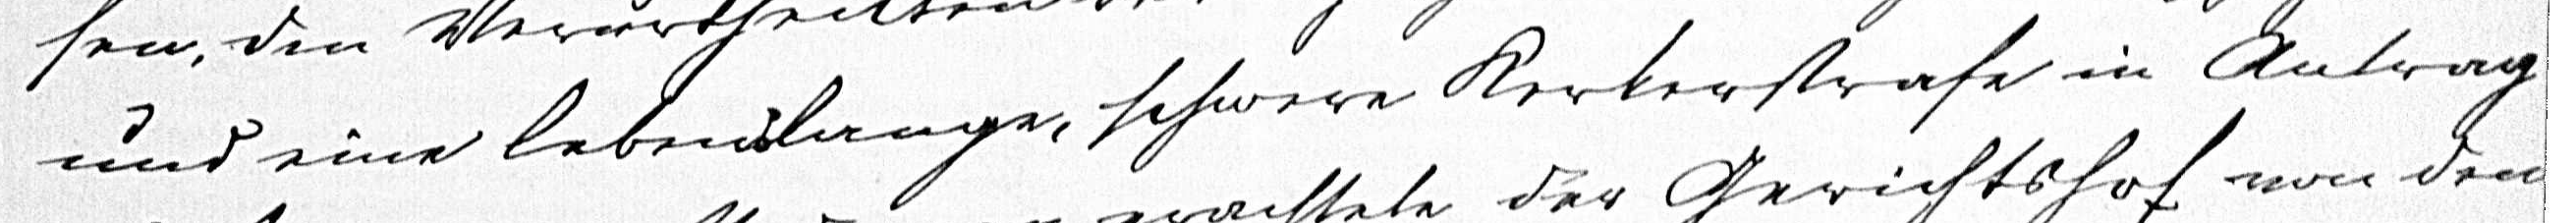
und eine lebenslange, schwere Kerkerstrafe in Antrag
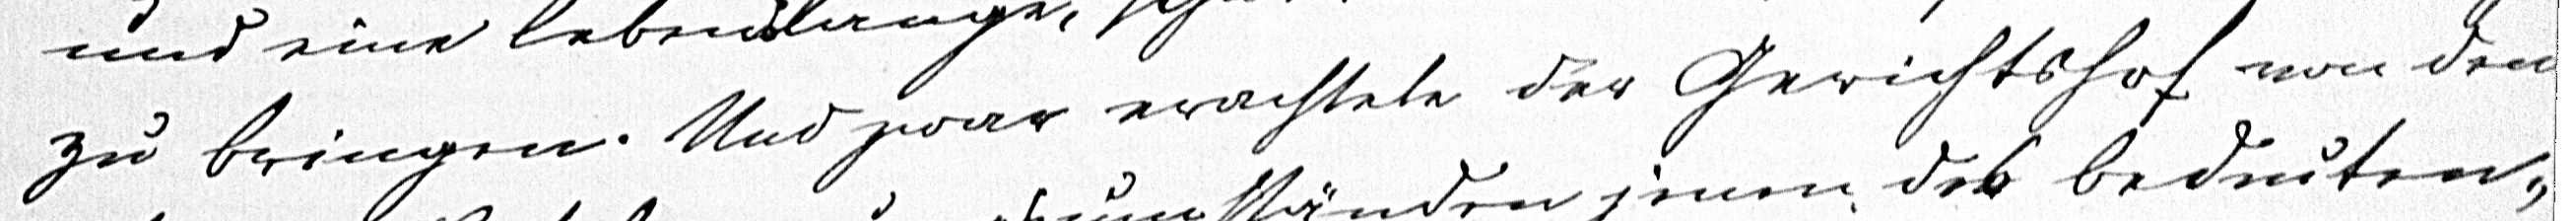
zu bringen. Und zwar erachtete der Gerichtshof vom den
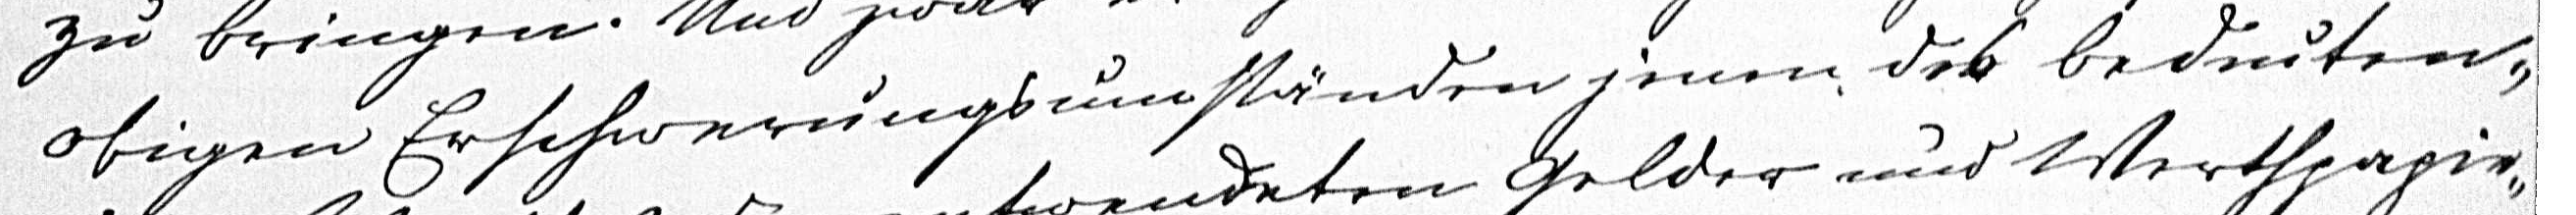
obigen Erschwerungsuständen jenen des bedeuten¬
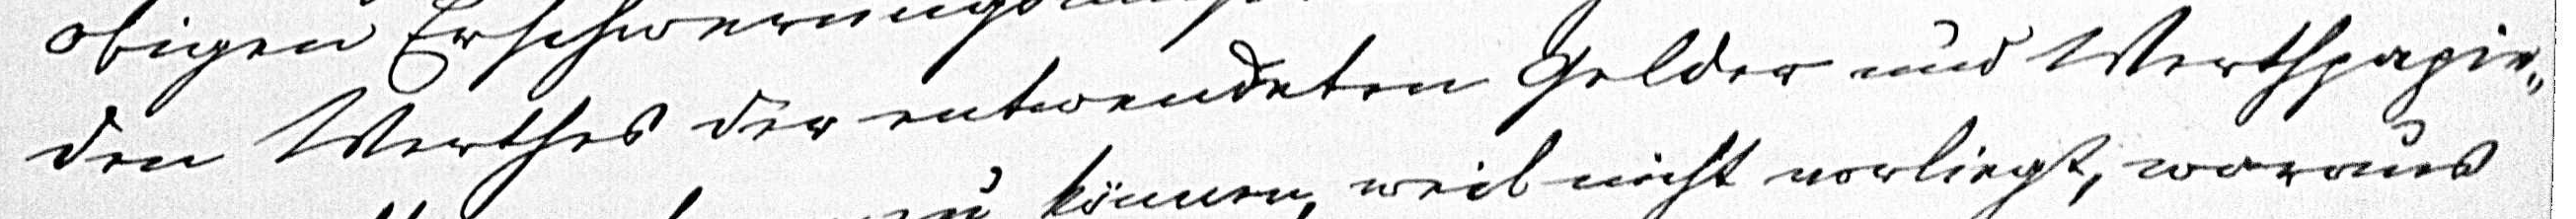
den Werthes der entwendeten Gelder und Werthpapie¬
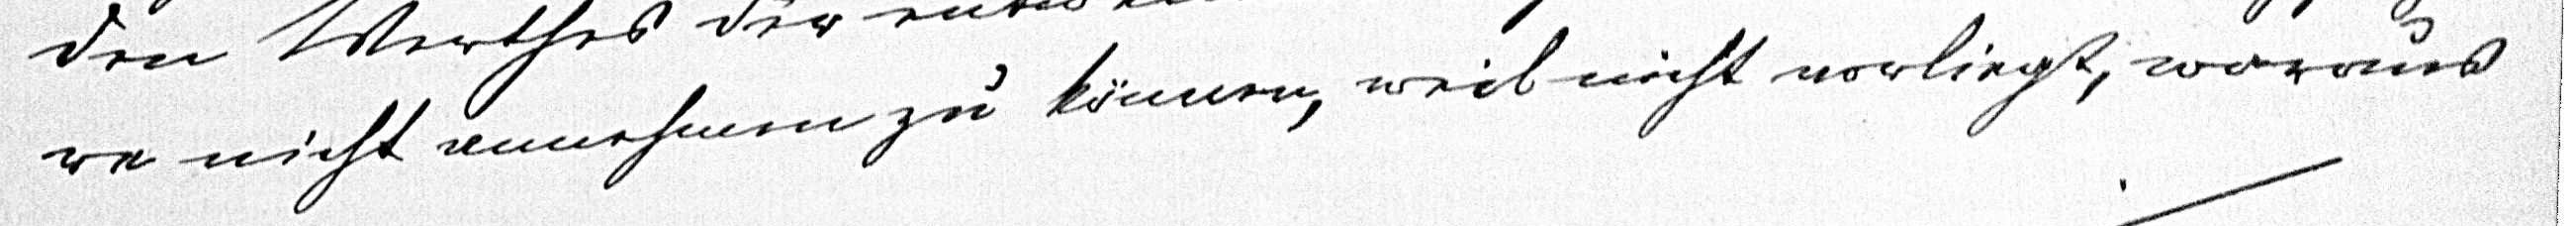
re nicht annehmen zu können, weil nicht vorliegt, woraus
